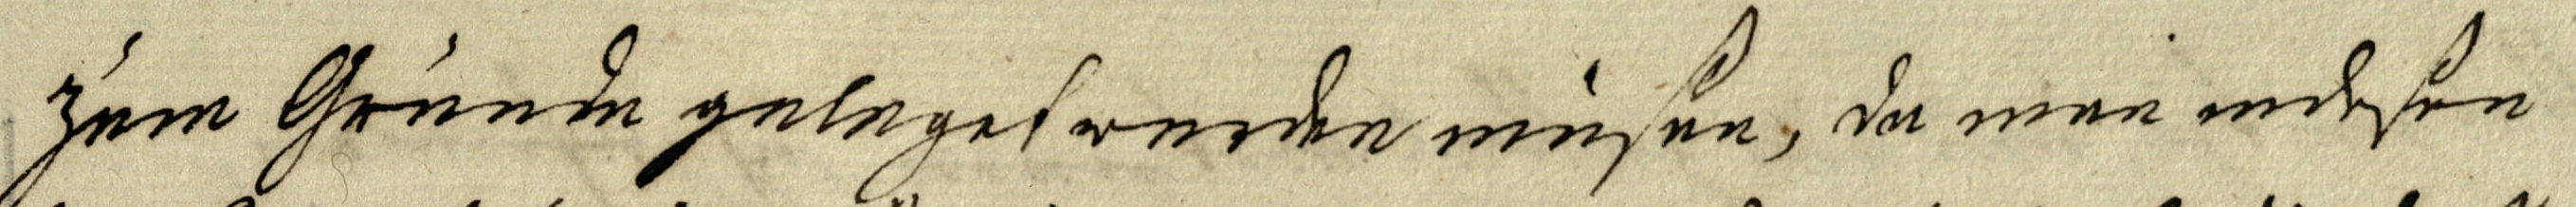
zum Grunde geleget werden müßen, da man indeßen
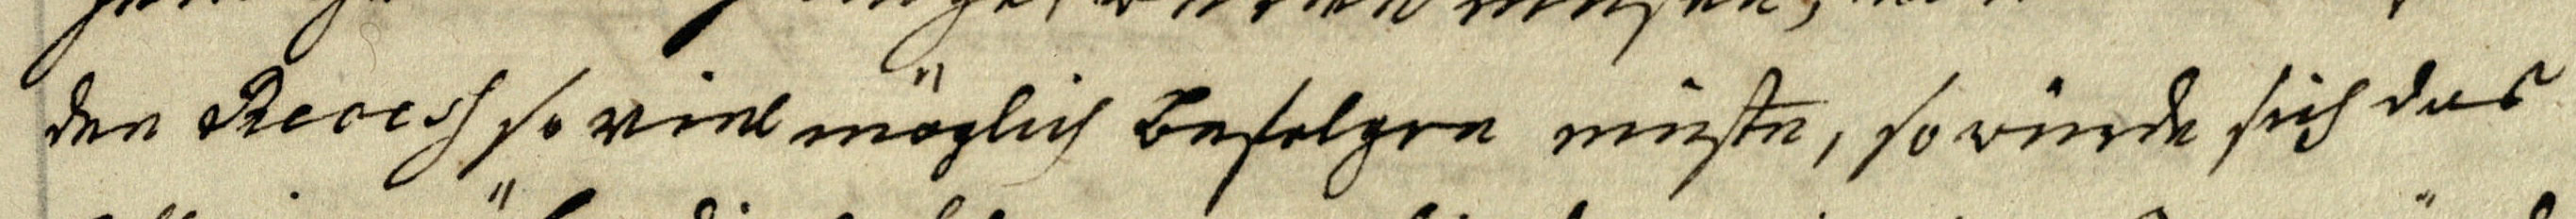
den Recess so viel möglich befolgen müste, so würde sich das
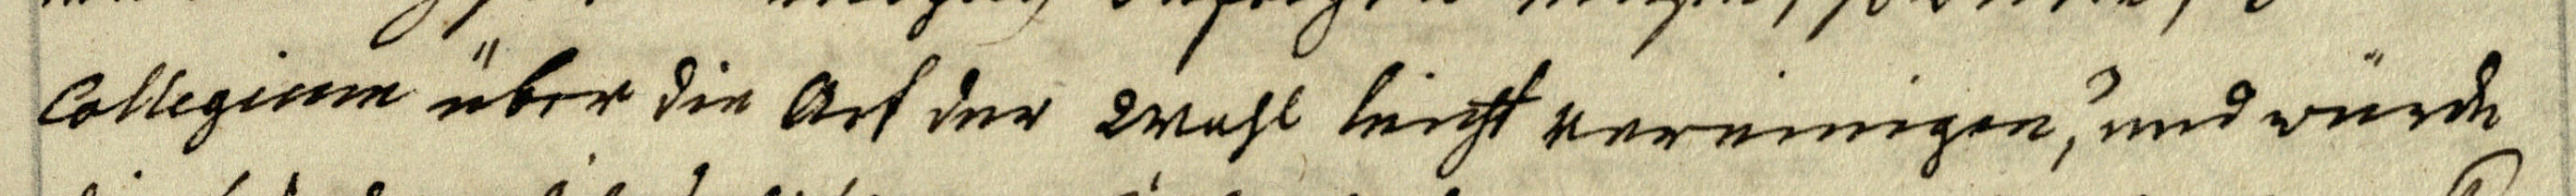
Collegium über die Art der Wahl leicht vereinigen, und würde
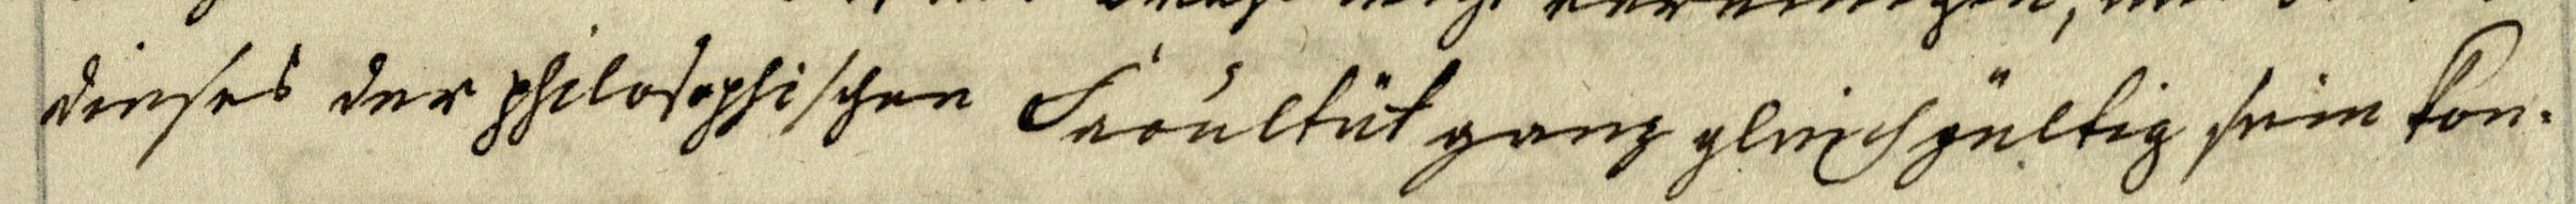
dieses der philosophischen Facultät ganz gleichgültig sein kon¬
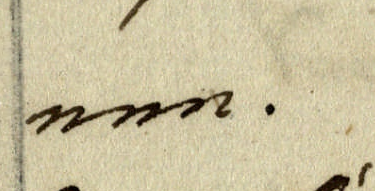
nen.
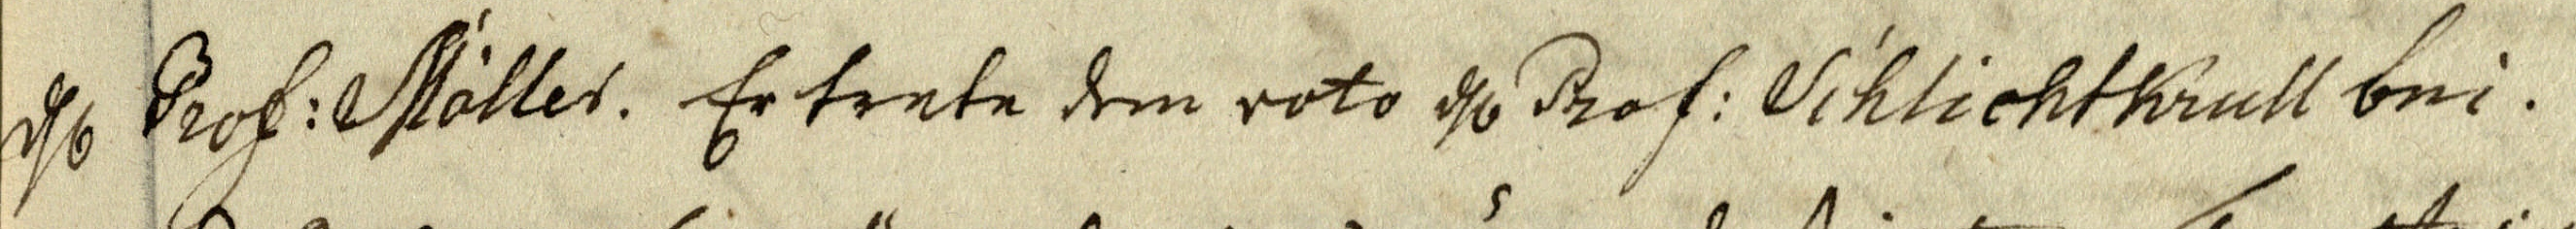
dh Prof. Möller. Er trete dem voto dh Prof. Schlichtkrull bei.
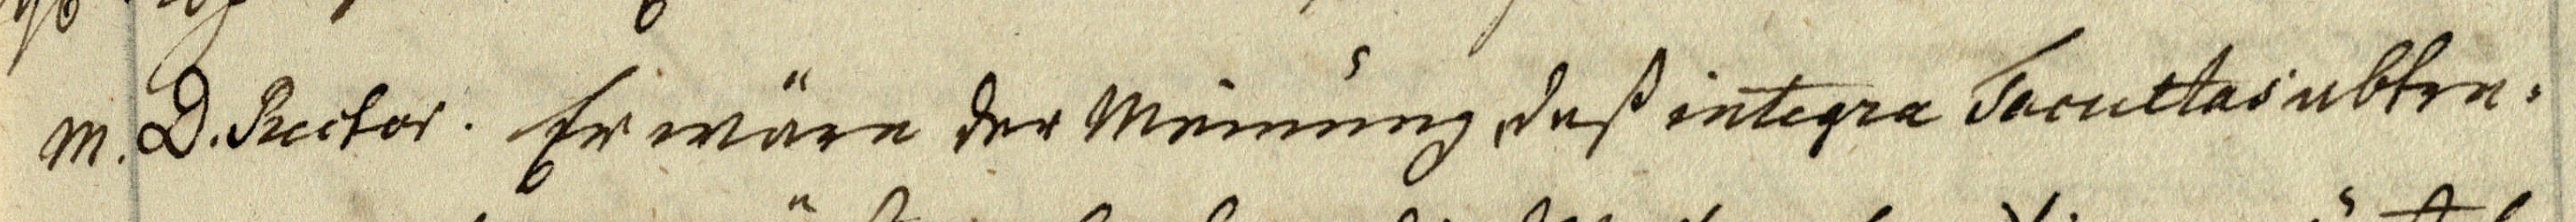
M. D. Rector. Er wäre der Meinung, daß integra Facultas abtre¬
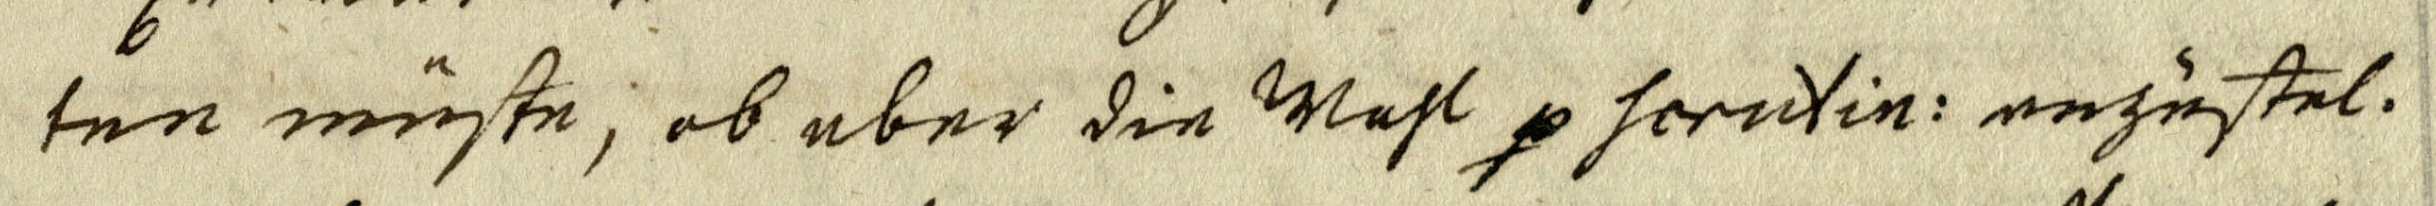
ten müste, ob aber die Wahl p scrutin. anzustel¬
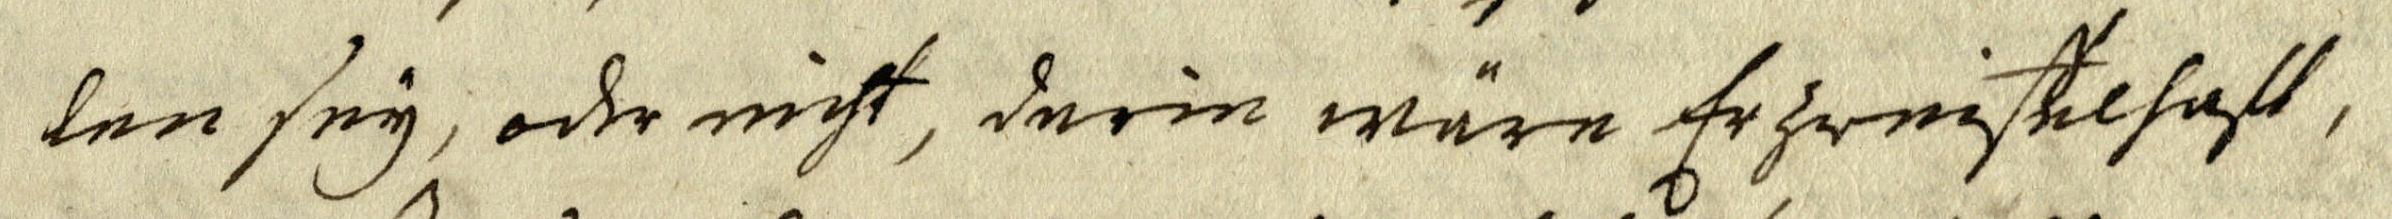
len seÿ, oder nicht, darin wäre Er zweiffelhaft,
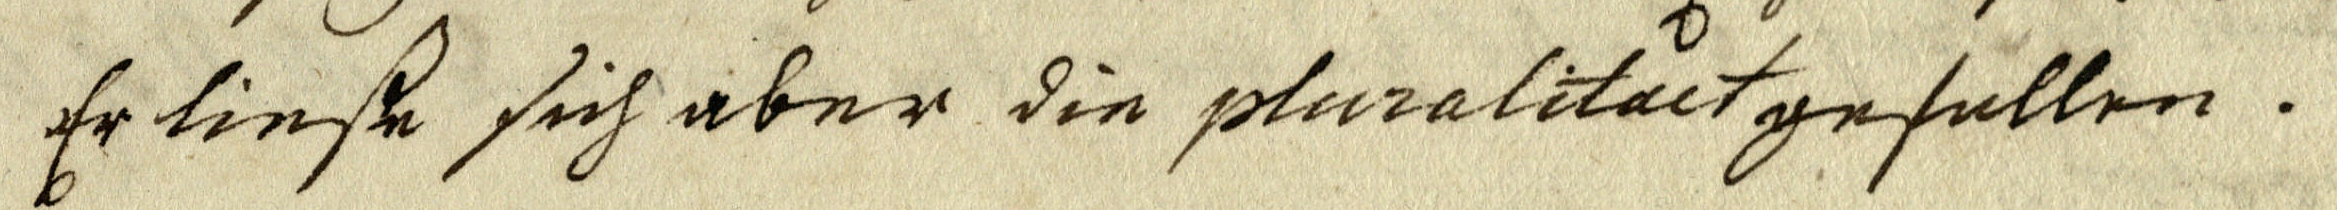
Er ließe sich aber die pluralitaet gefallen.
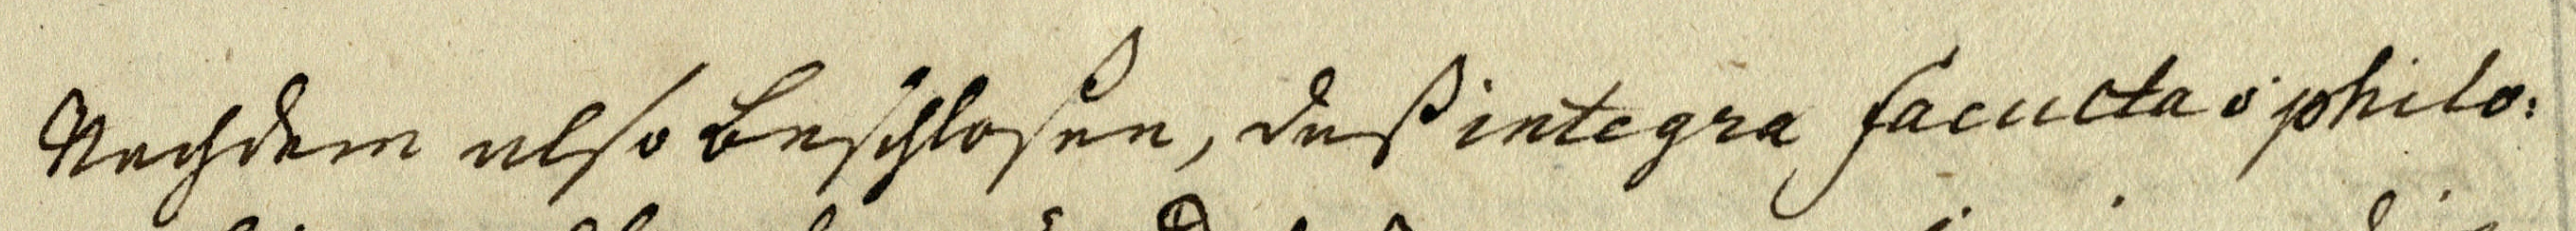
Nachdem also beschlossen, daß integra facultas philo¬
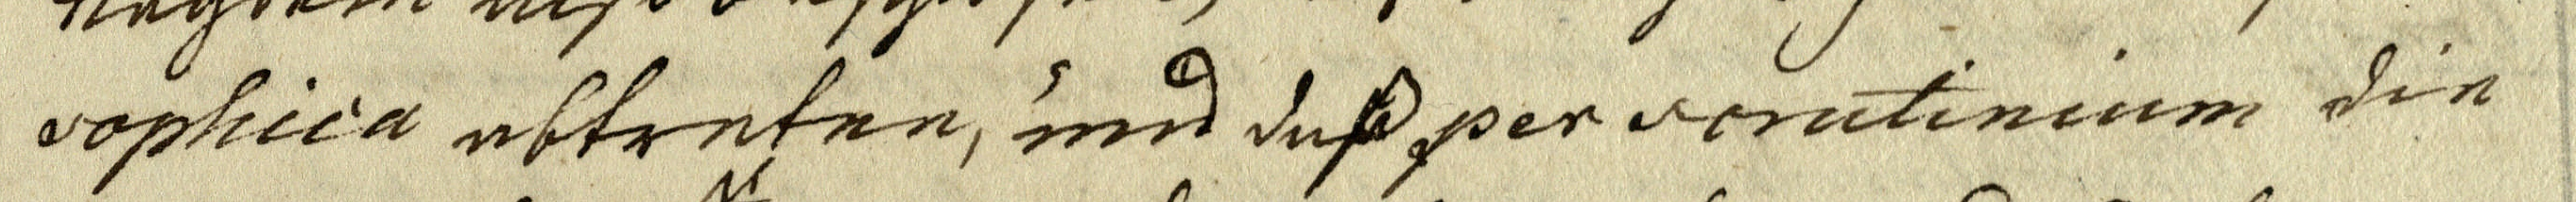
sophica abtreten, und daß per scrutinium die
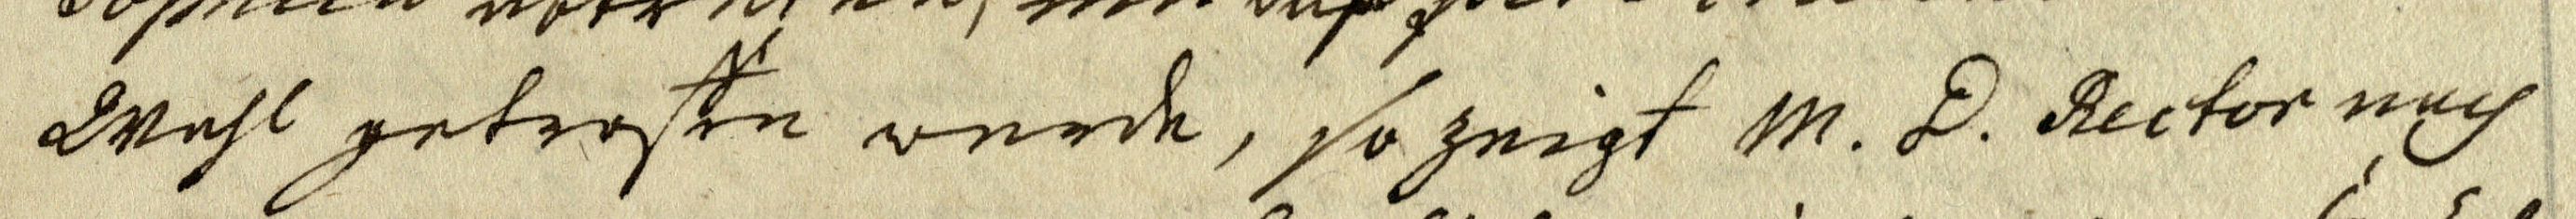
Wahl getroffen werde, so zeigt M. D. Rector nach
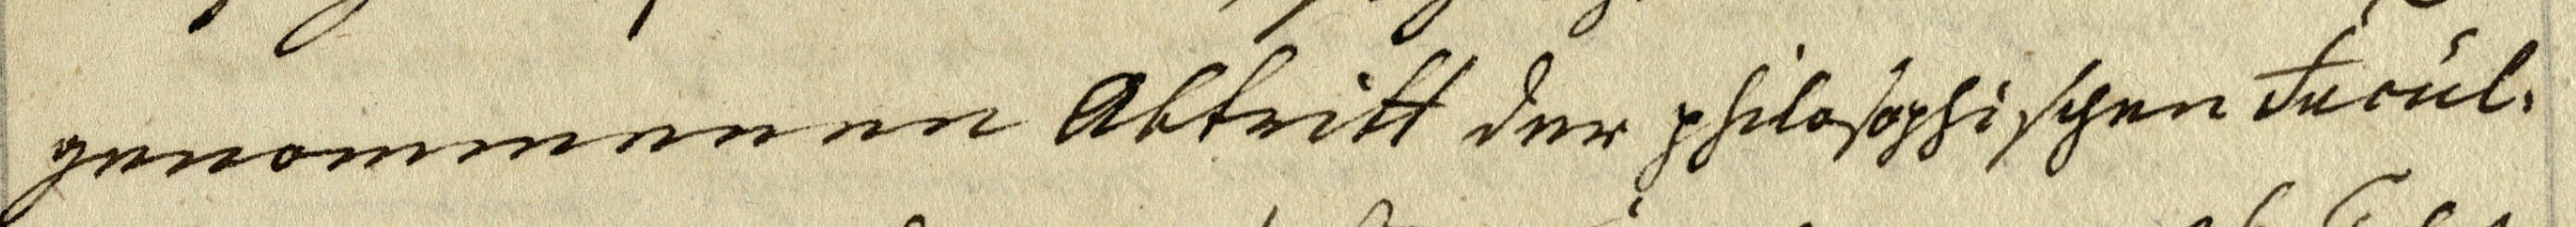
genommenen Abtritt der philosophischen Facul¬
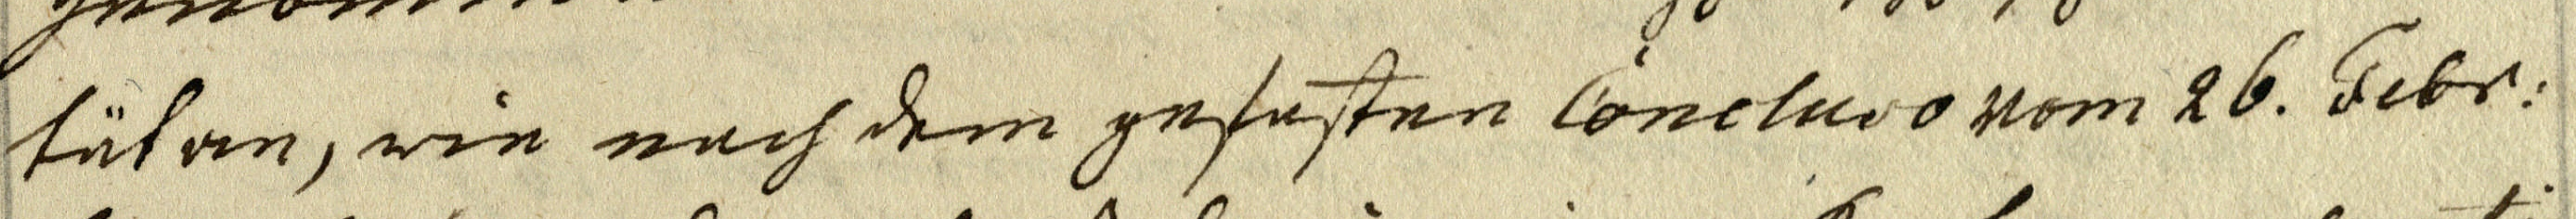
tät an, wie nach dem gefasten Concluso vom 26. Febr.
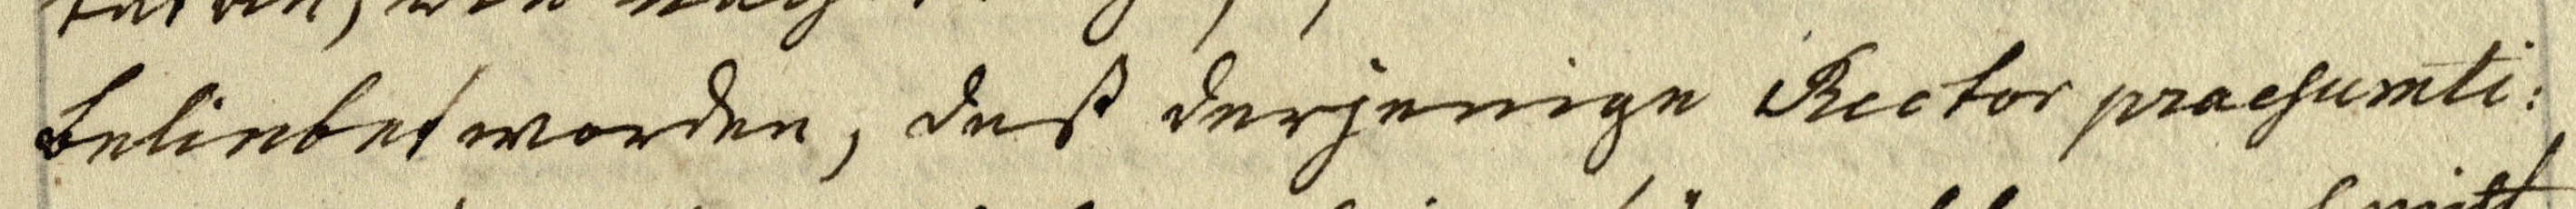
beliebet worden, daß derjenige Rector praesumti¬
